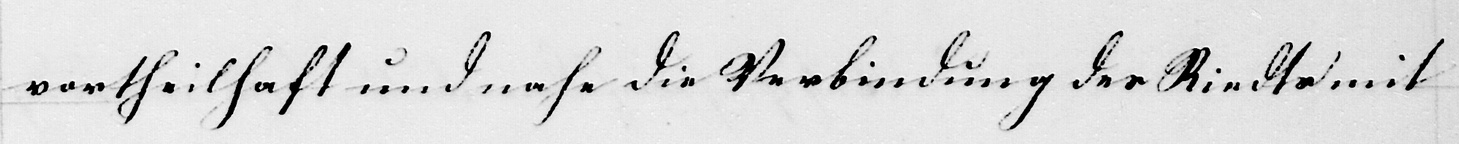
vortheilhaft und nahe die Verbindung des Riedts mit
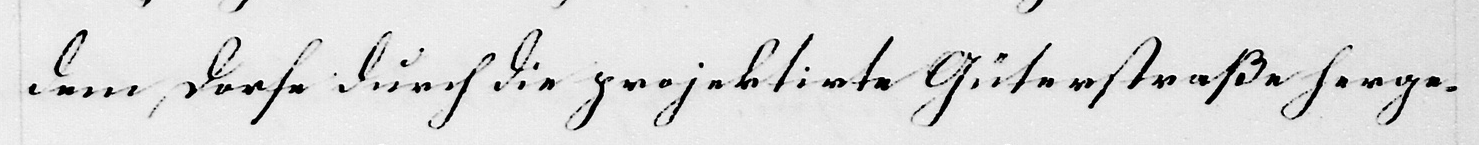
dem Dorfe durch die projektirte Güterstraße herge¬
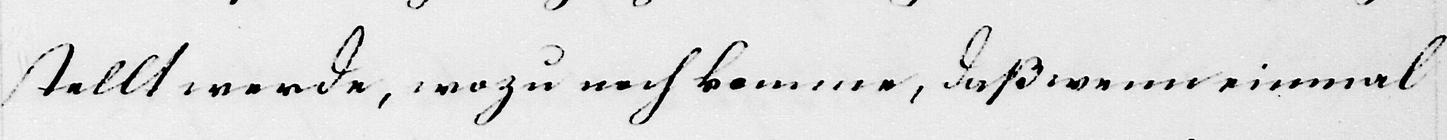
stellt werde, wozu noch komme, daß wenn einmal
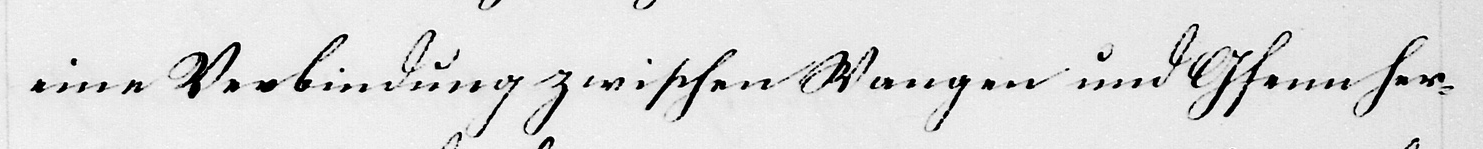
eine Verbindung zwischen Wangen und Gfenn her¬
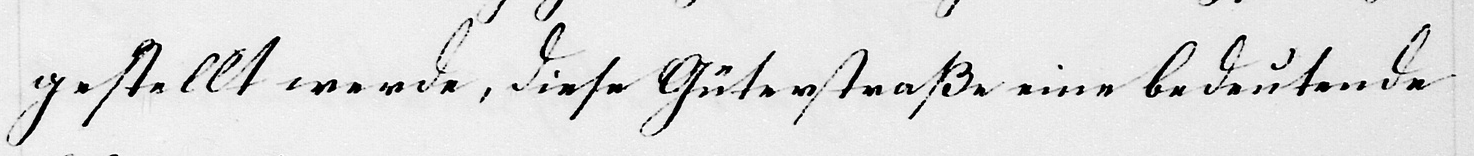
gestellt werde, diese Güterstraße eine bedeutende
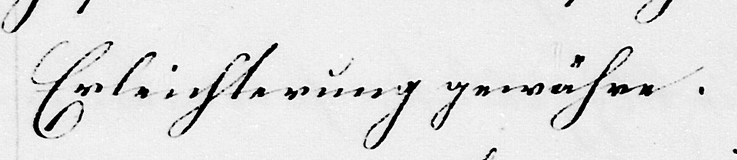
Erleichterung gewähre.
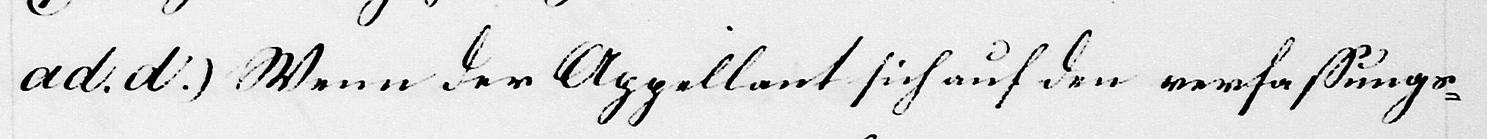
ad. d.) Wenn der Appellant sich auf den verfaßungs¬
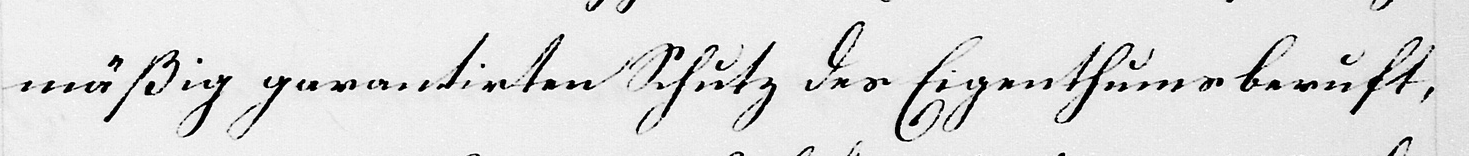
mäßig garantirten Schutz des Eigenthums beruft,
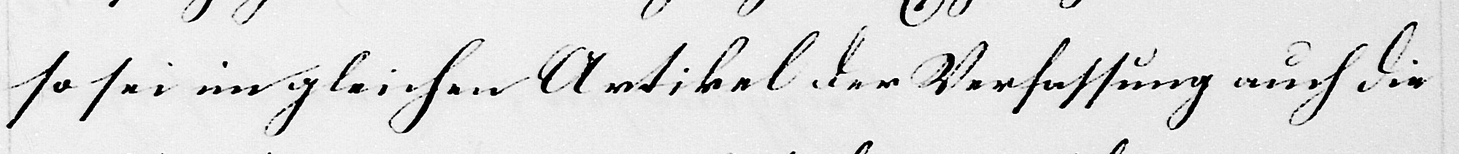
so sei im gleichen Artikel der Verfassung auch die
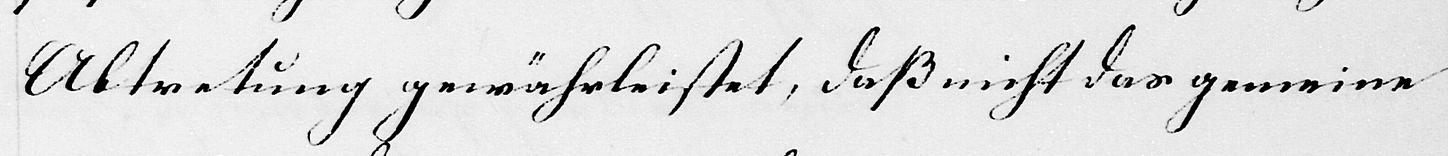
Abtretung gewährleistet, daß nicht das gemeine
